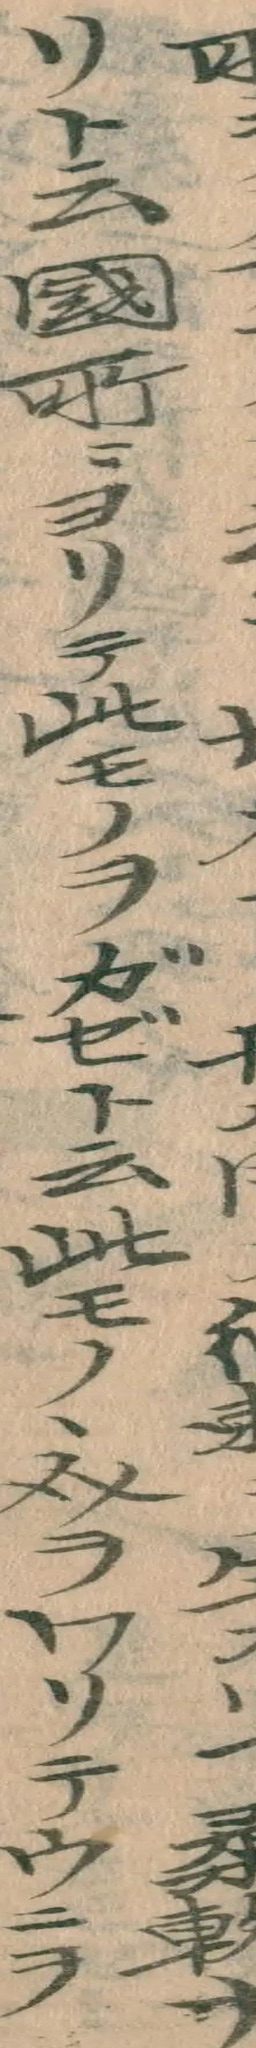リト云國所ニヨリテ此モノヲガゼト云此モノヽ介ヲワリテウニヲ
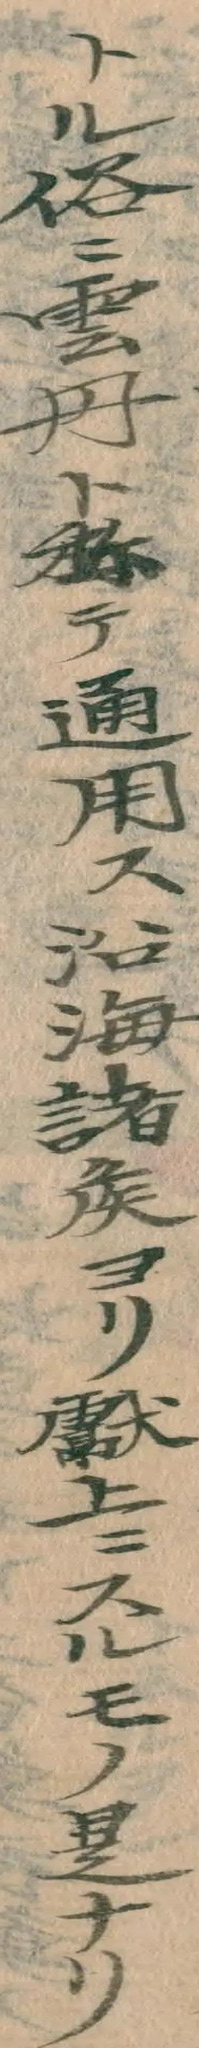トル俗ニ雲丹ト称テ通用ス沿海諸矦ヨリ獻上ニスルモノ是ナリ
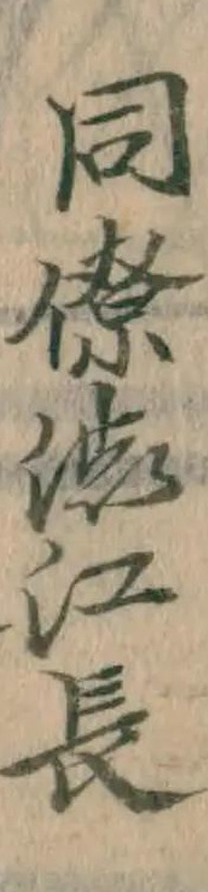同僚渋江長
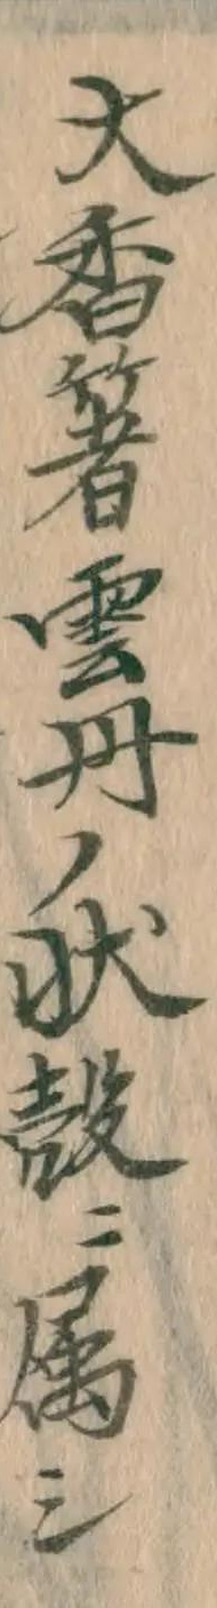大香箸雲丹ノ状殻ニ属シ
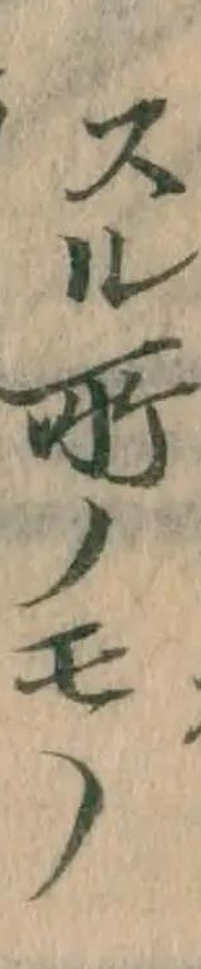スル所ノモノ
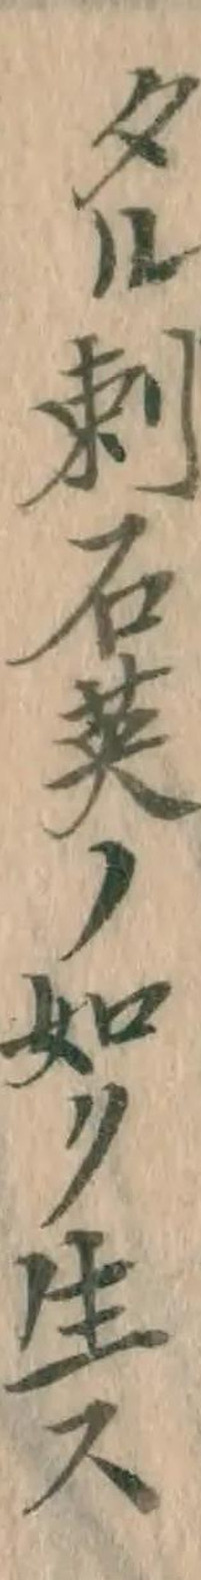タル刺石英ノ如ク生ス
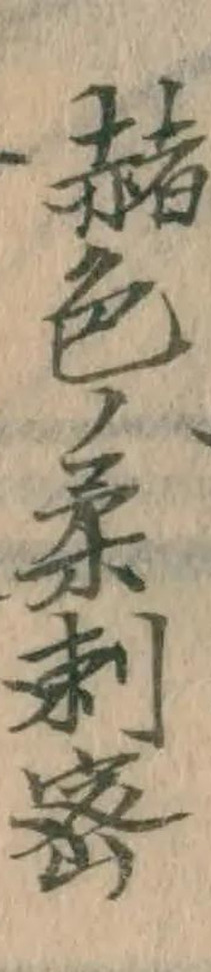赭色ノ柔刺密
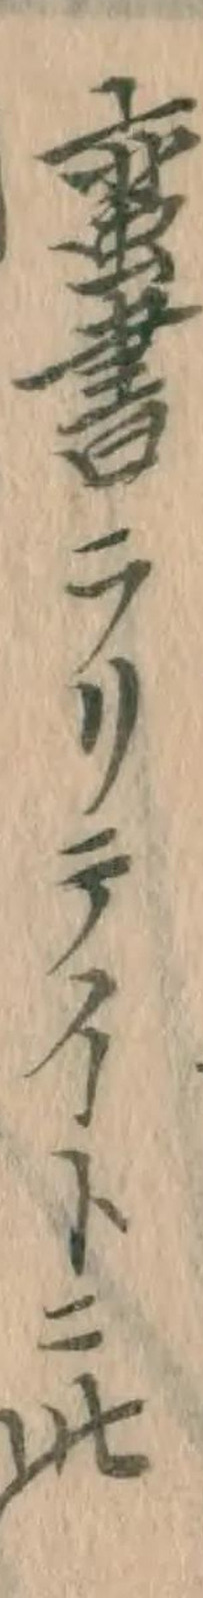蛮書ラリテイトニ此
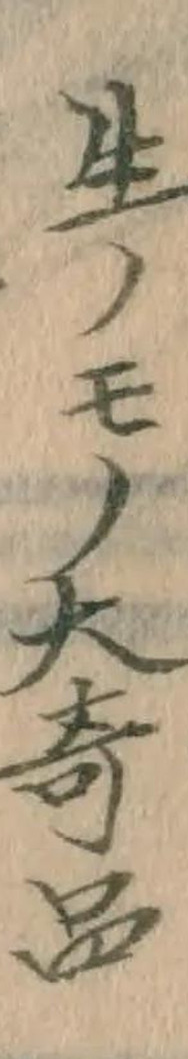生ノモノ大奇品
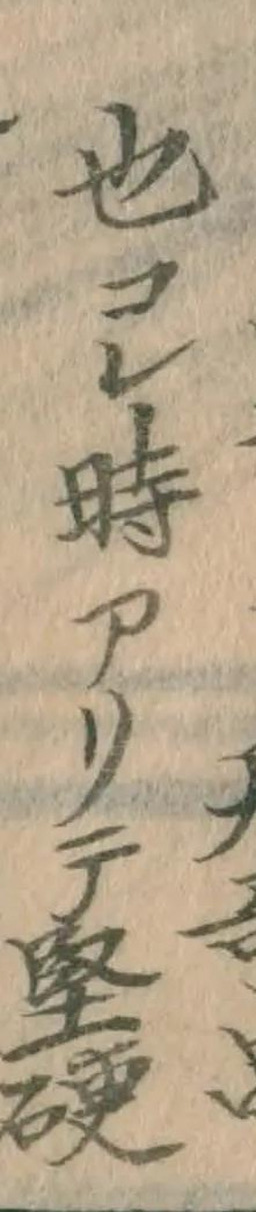也コレ時アリテ堅硬
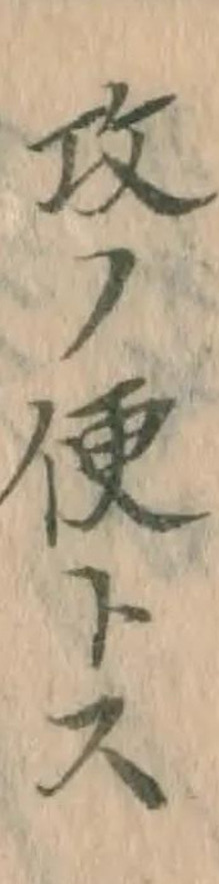攻ノ便トス
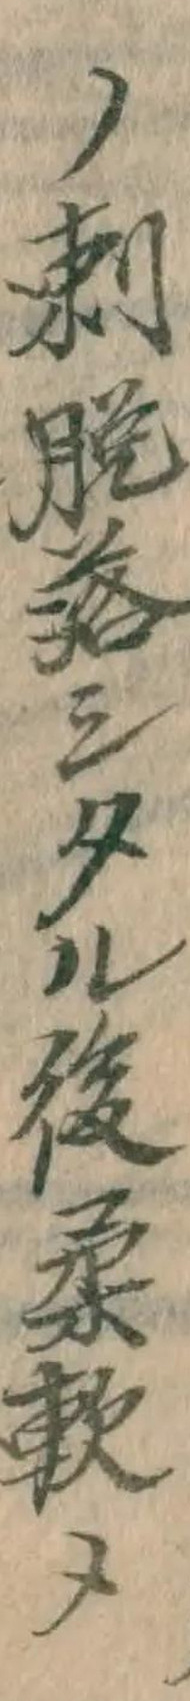ノ刺脱落シタル後柔軟シテ
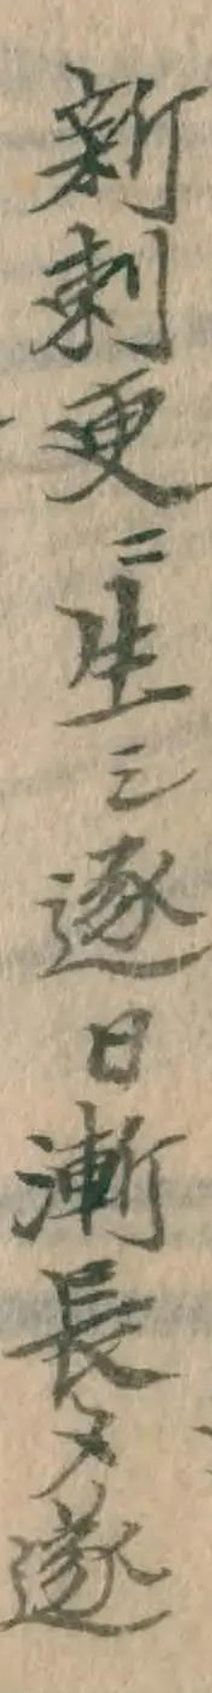新刺更ニ生シ遂ニ漸長シテ遂
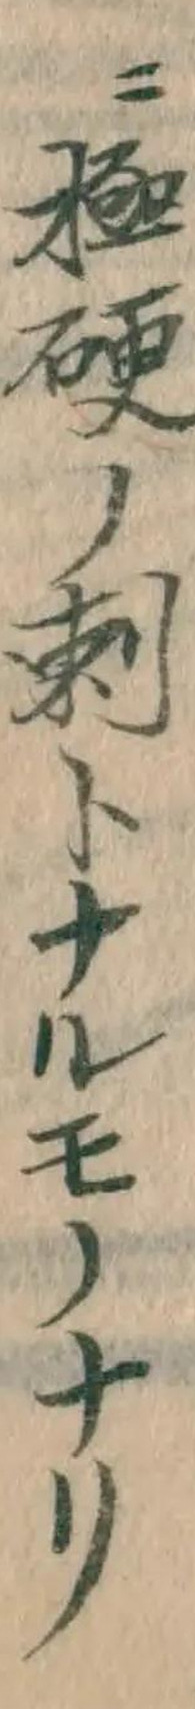ニ極硬ノ刺トナルモノナリ
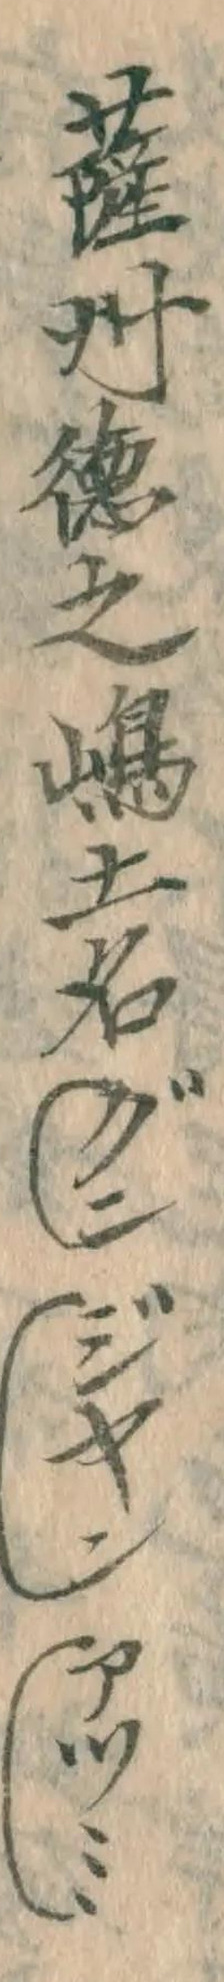薩州徳之嶋土名グンジャンアツミ
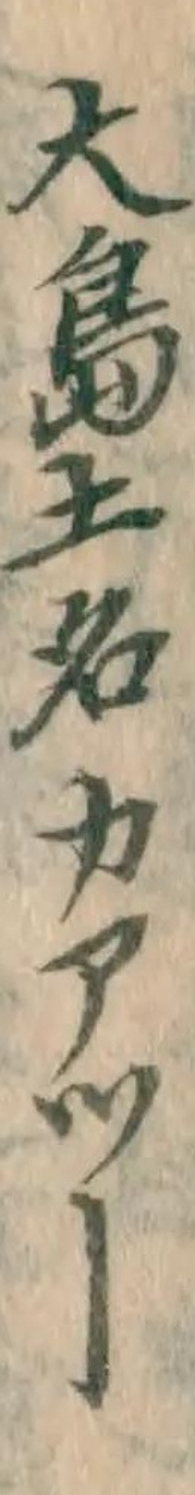大島土名カアツー
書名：千蟲譜 3巻. [2]
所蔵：国立国会図書館 National Diet Library, JAPAN
